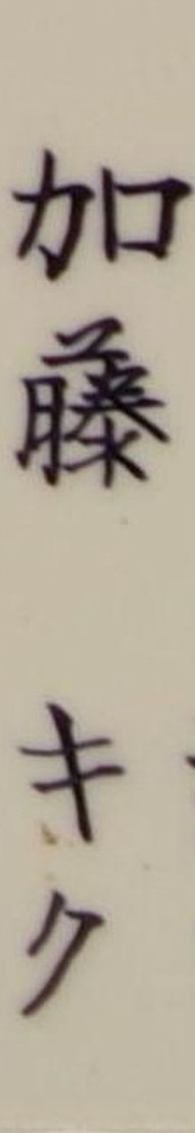加藤キク
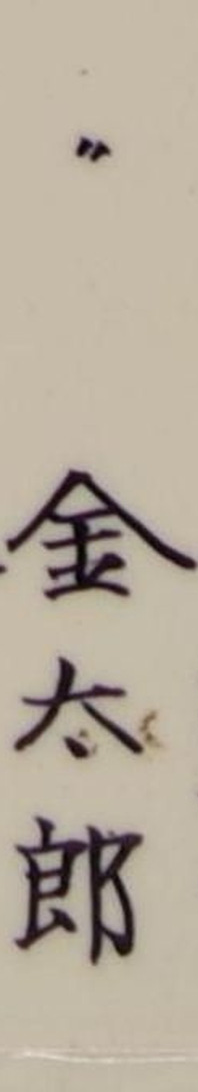金太郎
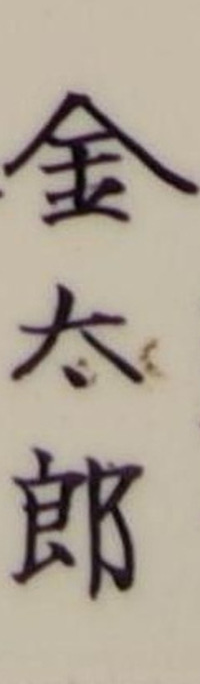金太郎
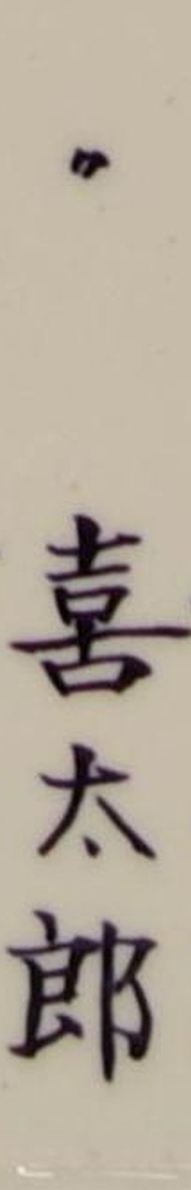喜太郎
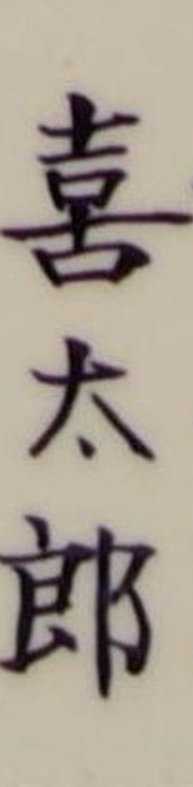喜太郎
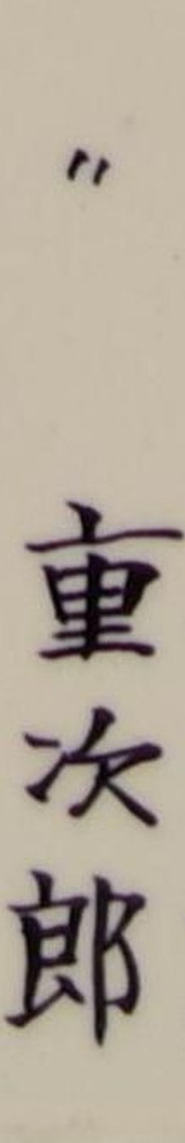重次郎
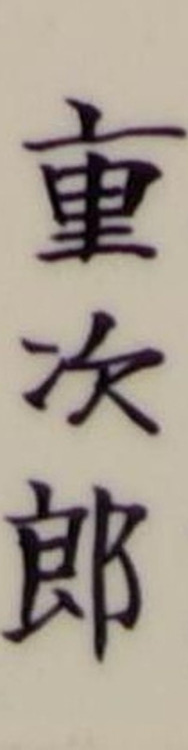重次郎
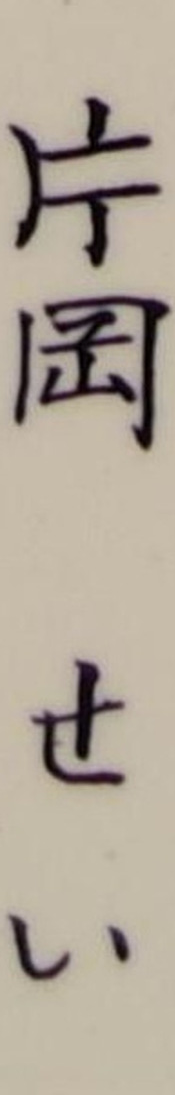片岡せい
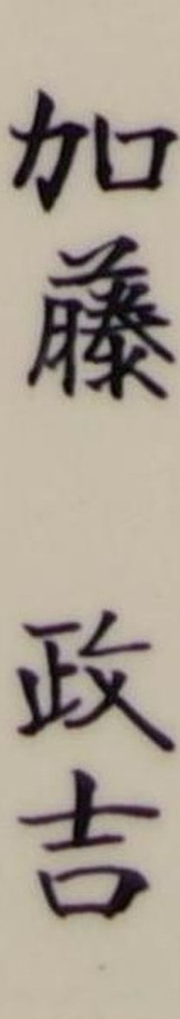加藤政吉
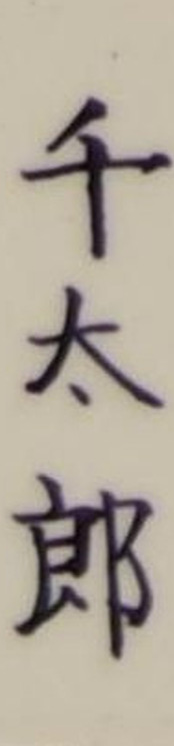千太郎
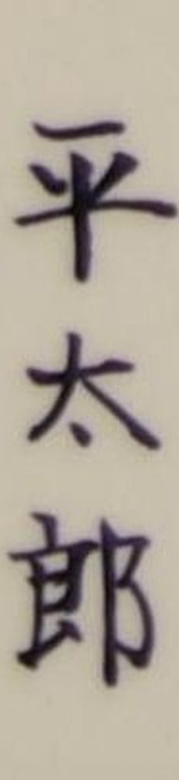平太郎
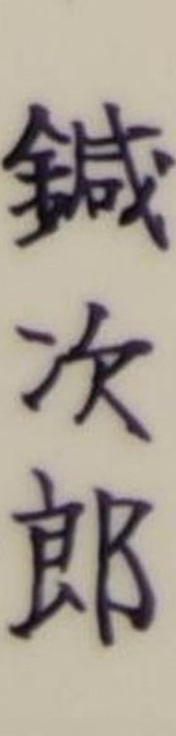重次郎

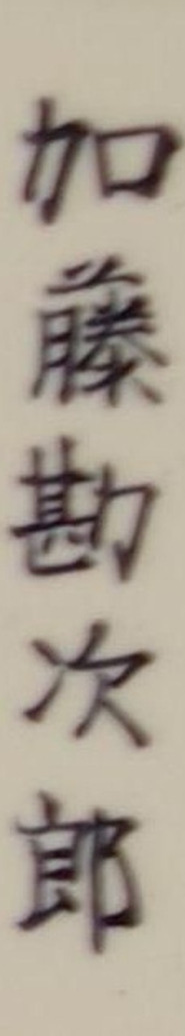加藤勘次郎
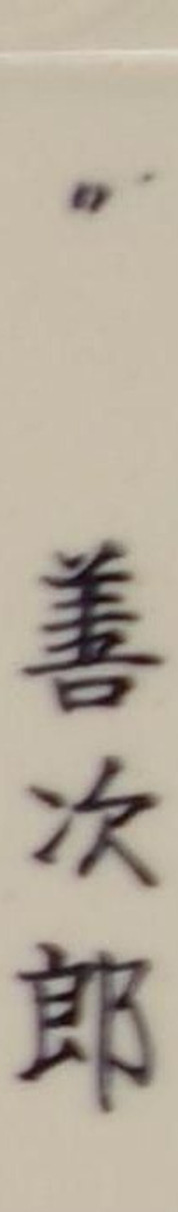善次郎
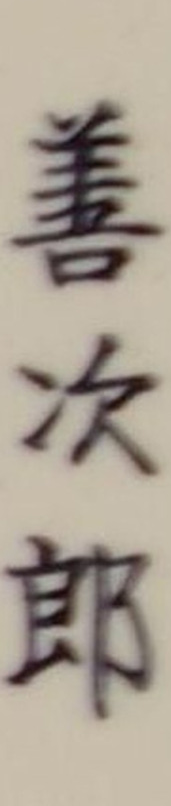善次郎
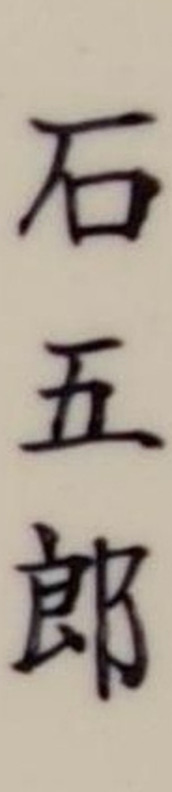石五郎
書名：M~S
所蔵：高野山金剛峯寺
